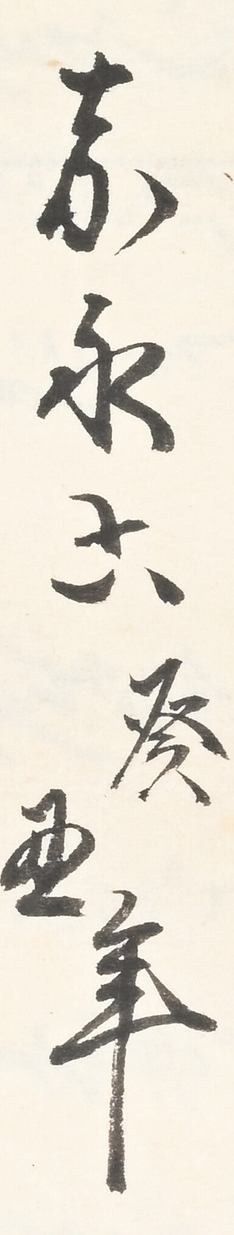嘉永六癸丑年
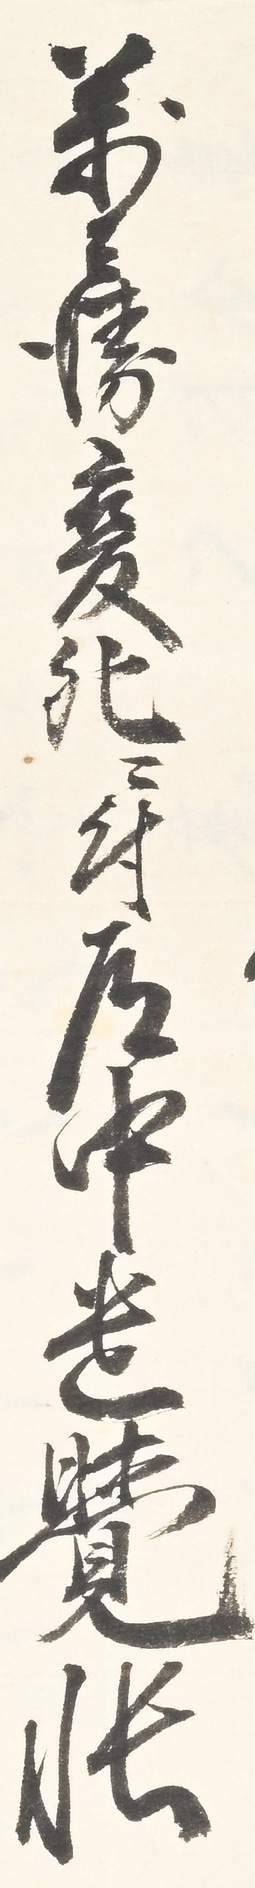万兵衛変死ニ付道中遣覚帳
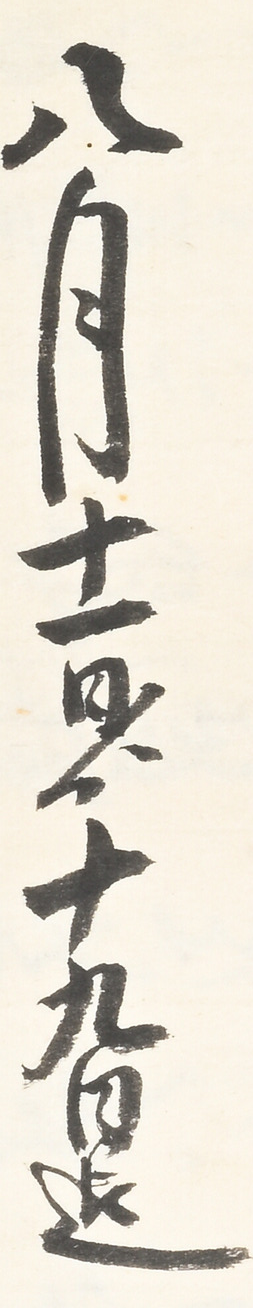八月十一日ゟ十九日迄
